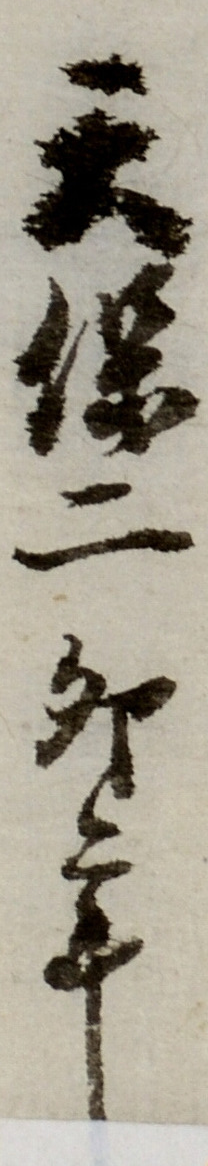天保二卯年
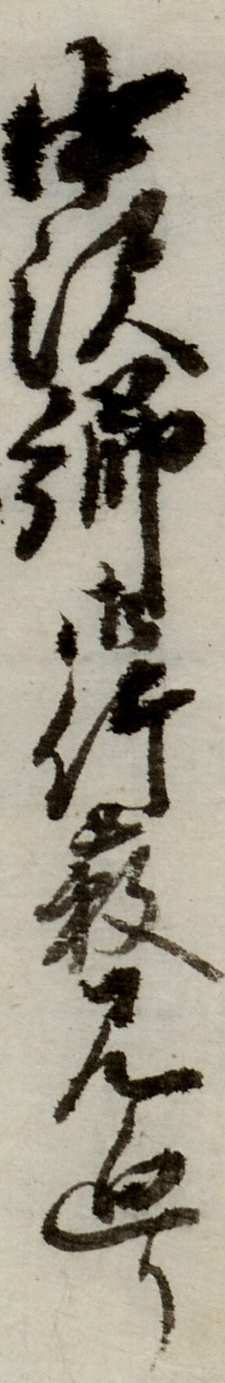中沢郷御竹藪見廻り
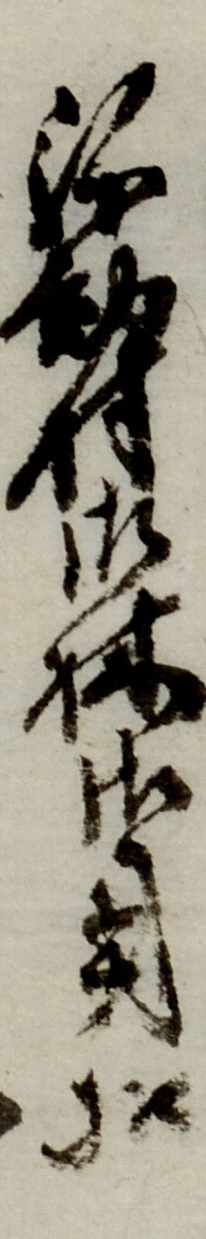泊飯付御林御用扣
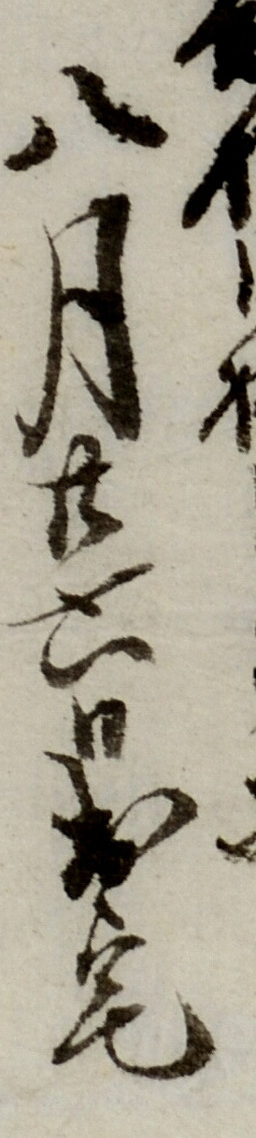八月廿六日出宅

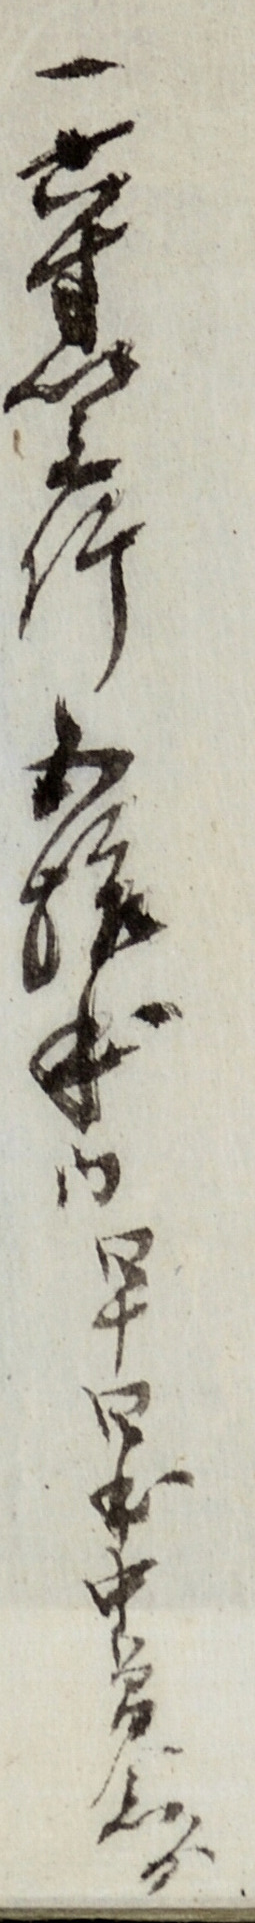一六寸以上竹五拾本内四十四本中曾倉ゟ
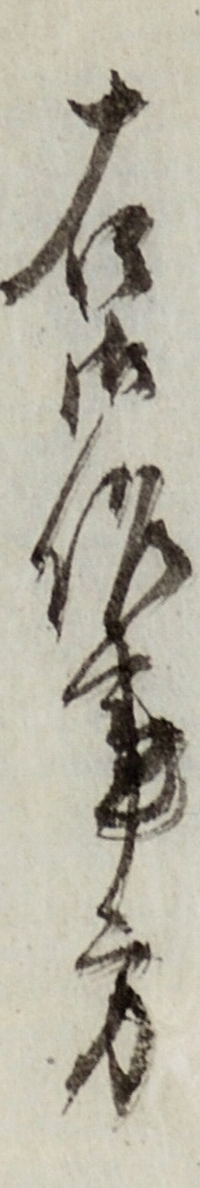右御作事方
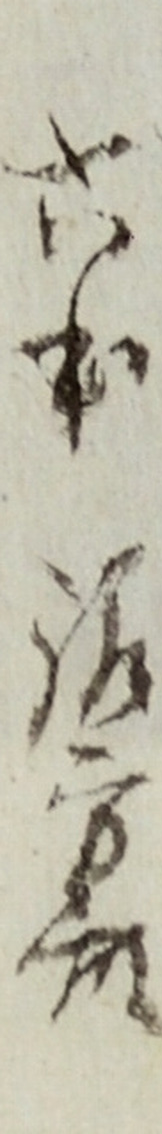六本諏方形
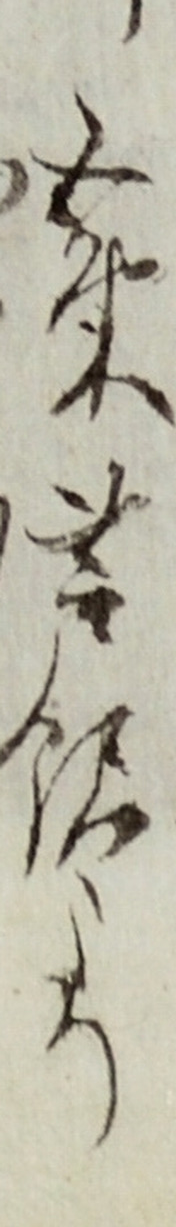五束芦沢より
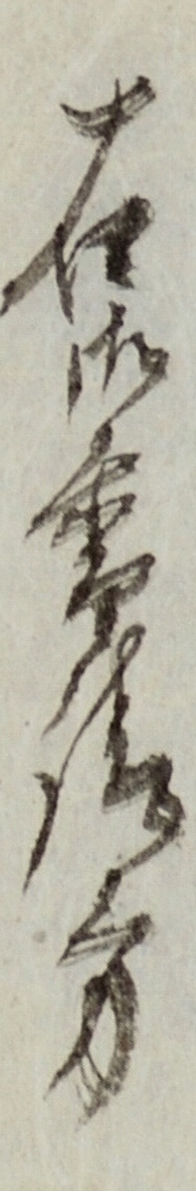右御作事方
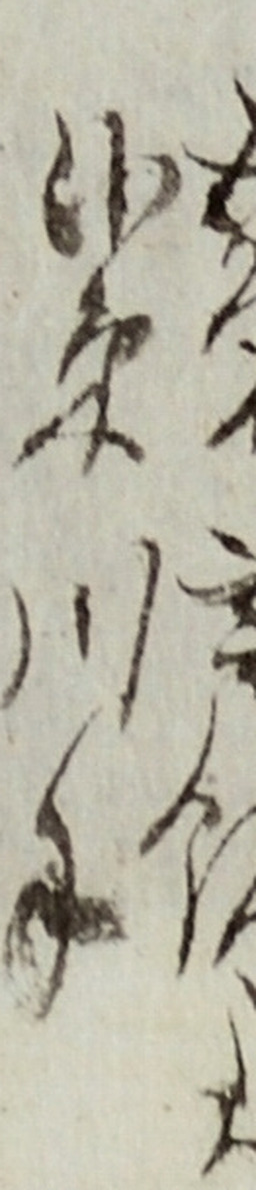弐束川手
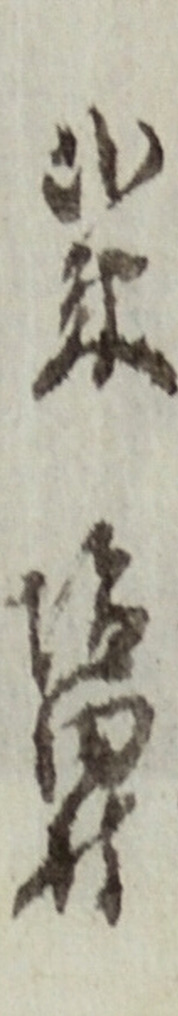二束塩田村

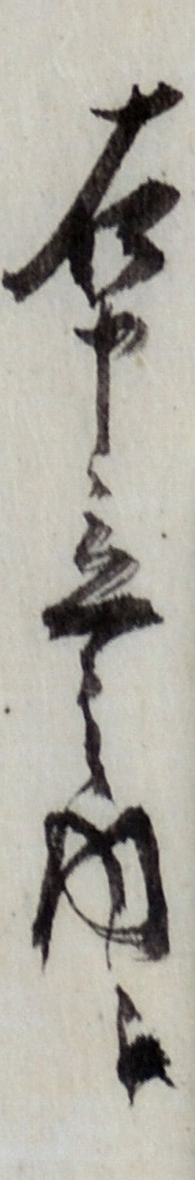右申立之内江
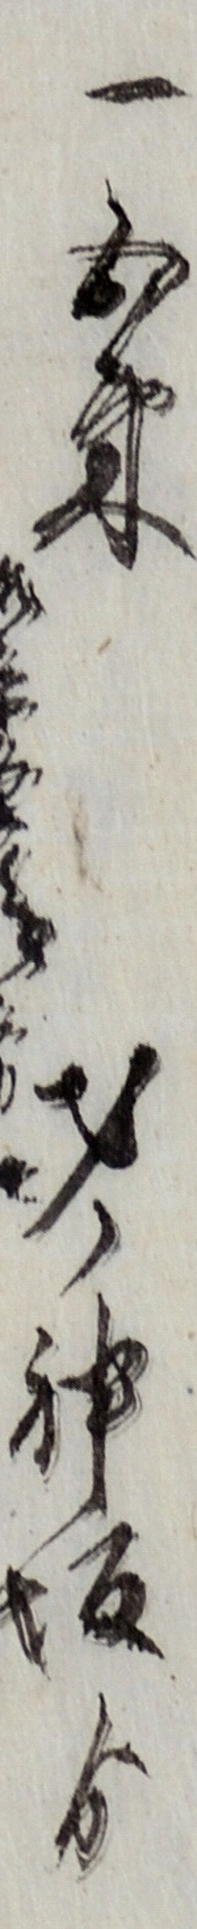一五束才ノ神坂ゟ
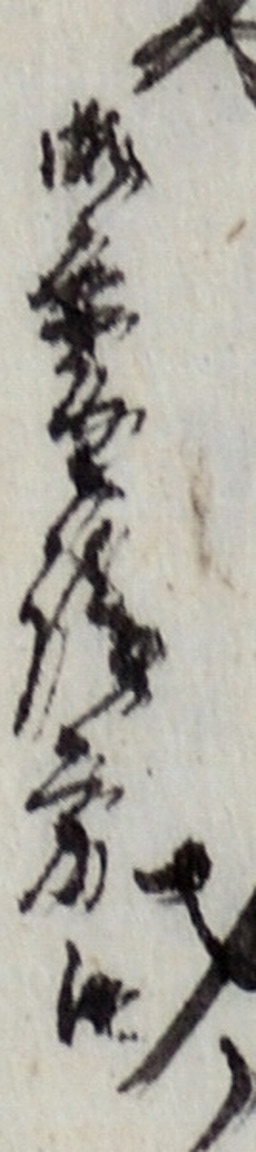御普請方江
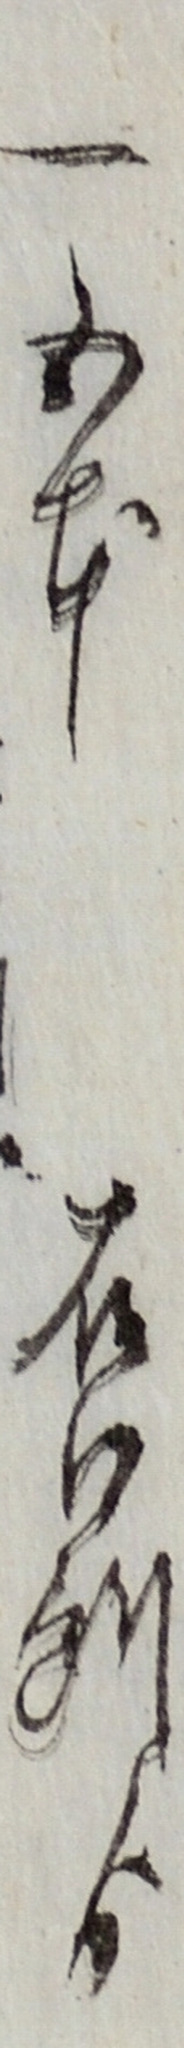一五本右同断ゟ
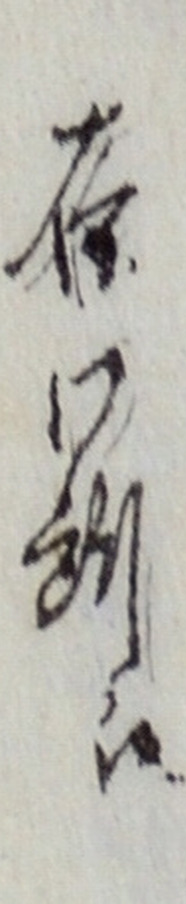右同所江
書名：中沢郷御竹薮見廻り
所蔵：伊那市立高遠町図書館・合同会社AMANE
